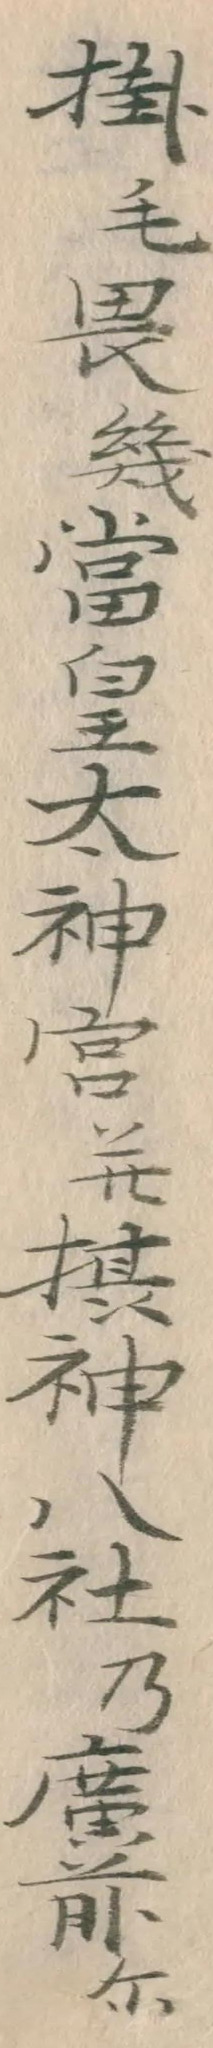掛毛畏幾當皇太神宮并摂神八社乃広前尒
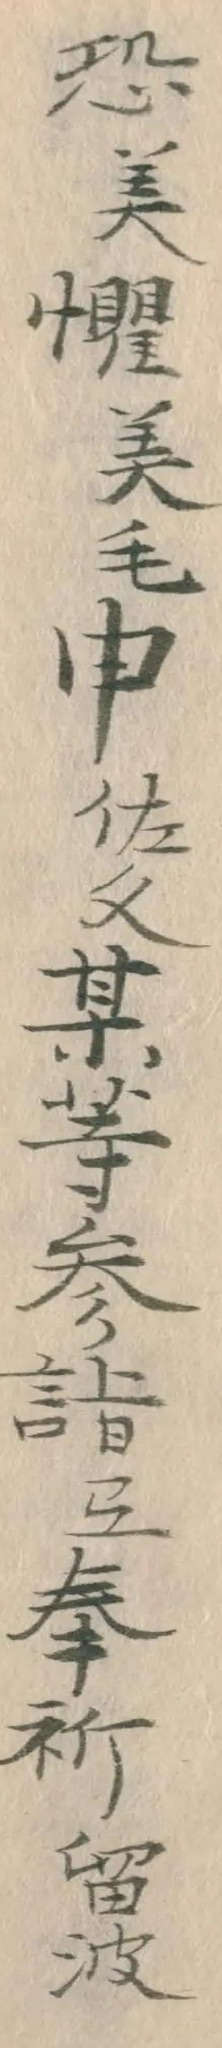恐美懼美毛申佐文某等参詣弖奉祈留波
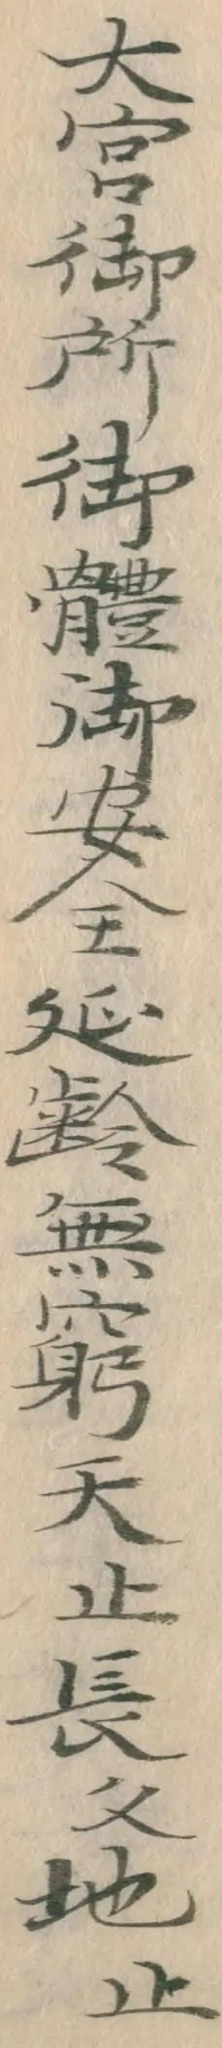大宮御所御體御安全延齢無窮天止長久地止

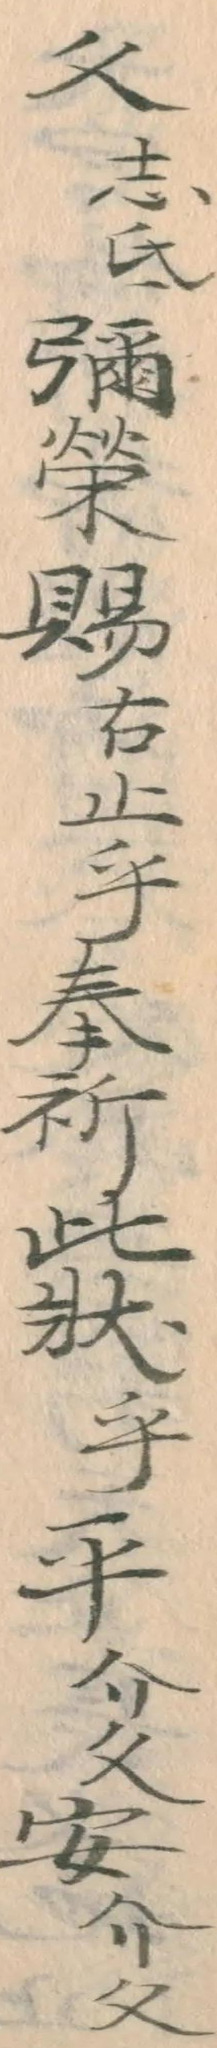久志氐彌榮賜古止乎奉祈此状乎平介久安介久
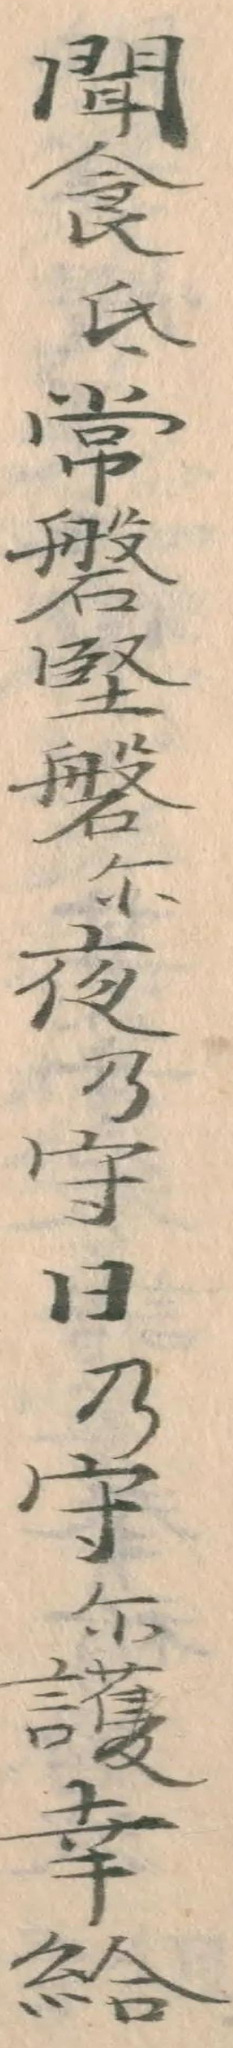聞食氐常磐堅磐尓夜乃守日乃守尓護幸給
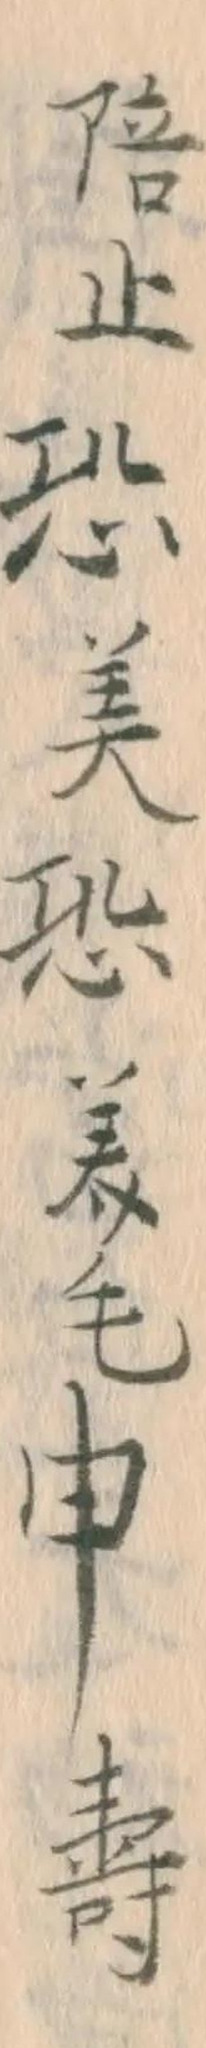陪止恐美恐美毛申壽
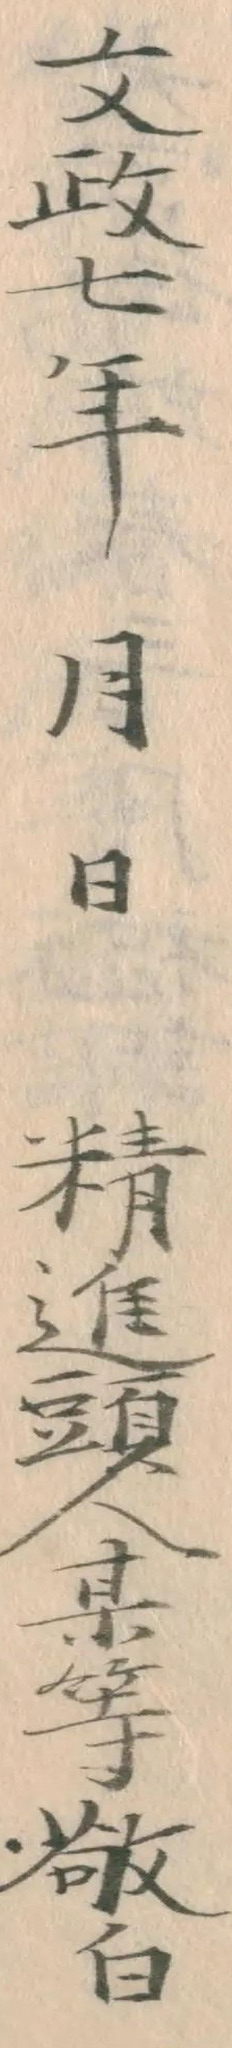文政七年月日精進頭人某等敬白
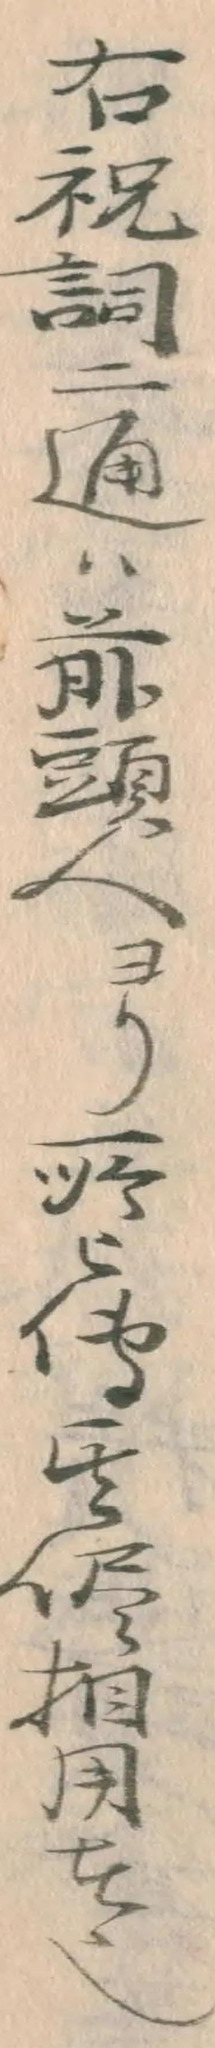右祝詞二通ハ前頭人ヨリ所被傳其侭相用在也
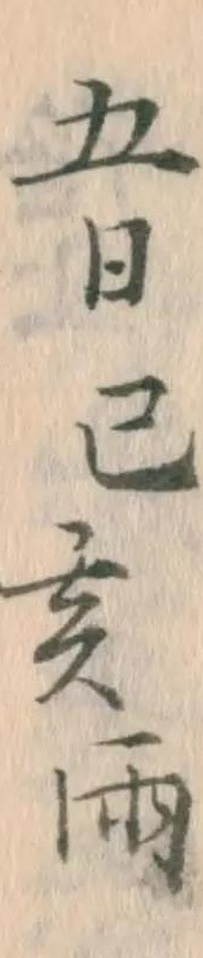五日己亥雨
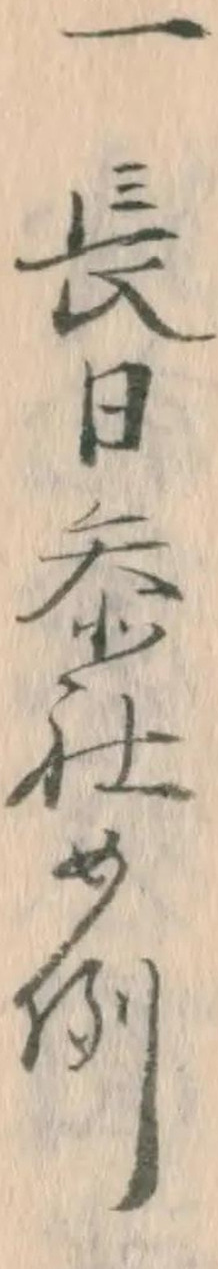一長日参社如例
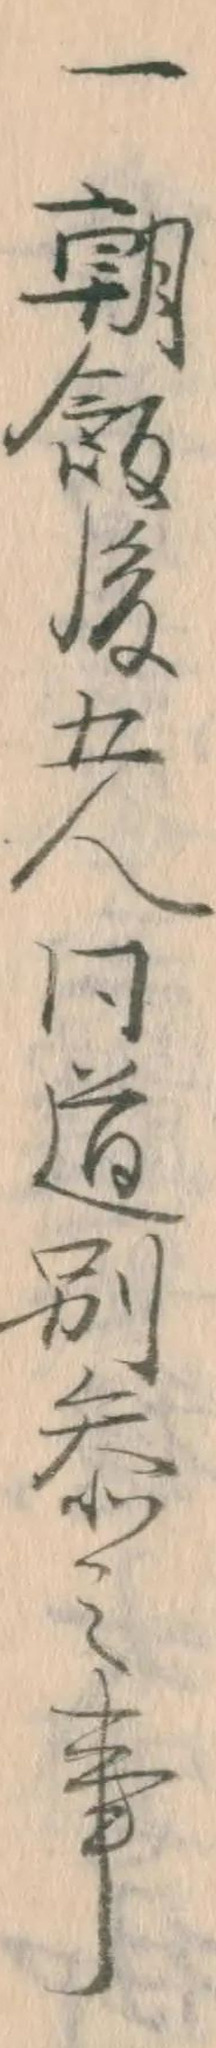一朝飯後五人同道別参之事
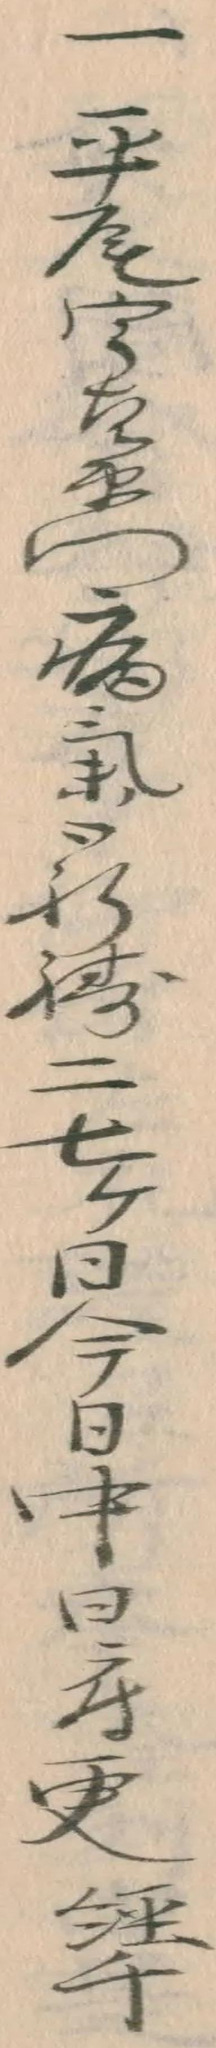一平尾宇左衛門病氣御祈祷二七ヶ日今日中日ニ付更経千
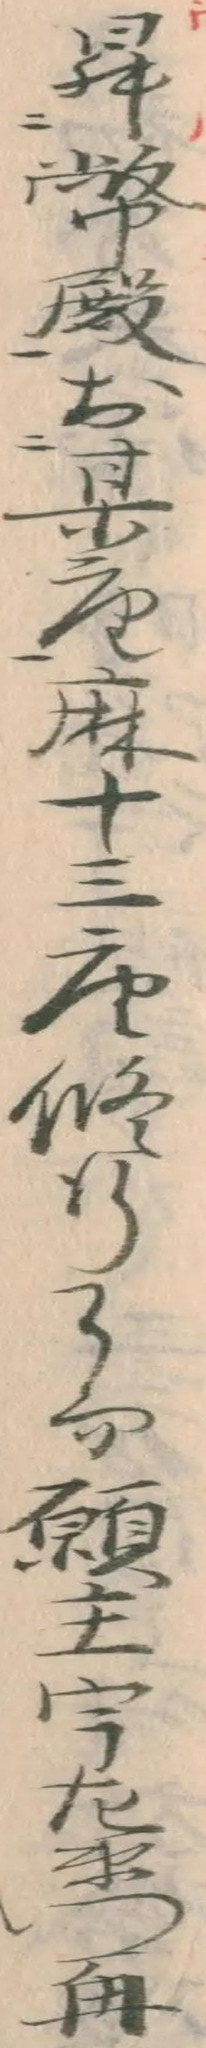昇殿於於某座麻十三座修行了而願主宇左衛門再
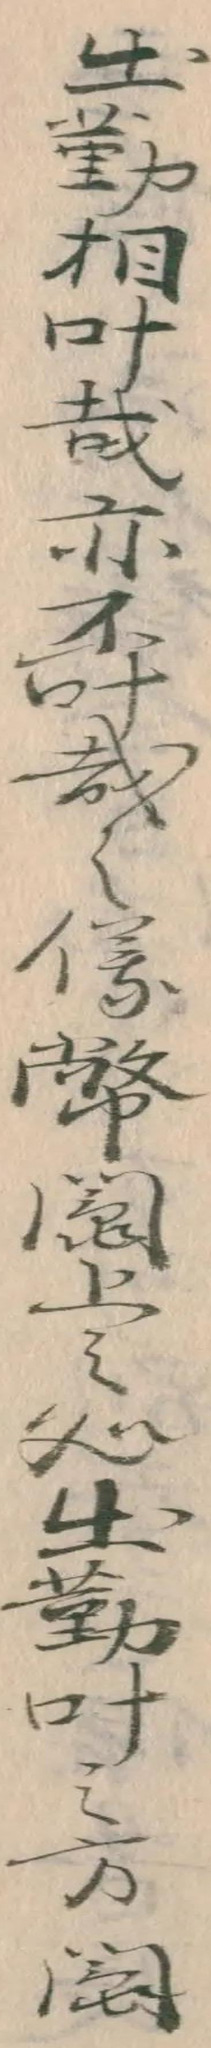出勤相叶哉亦不叶哉之儀幣鬮上之処出勤叶之方鬮
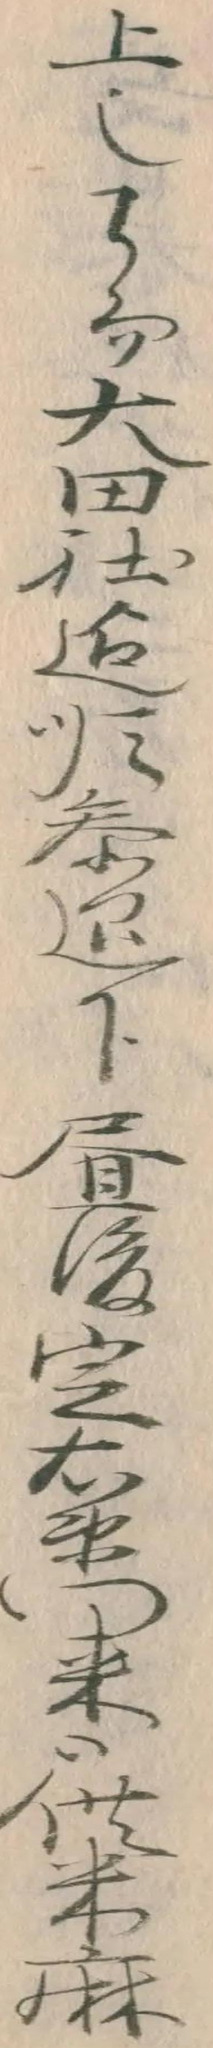上也了而大田社迄順参退下昼後定右衛門来御供米麻
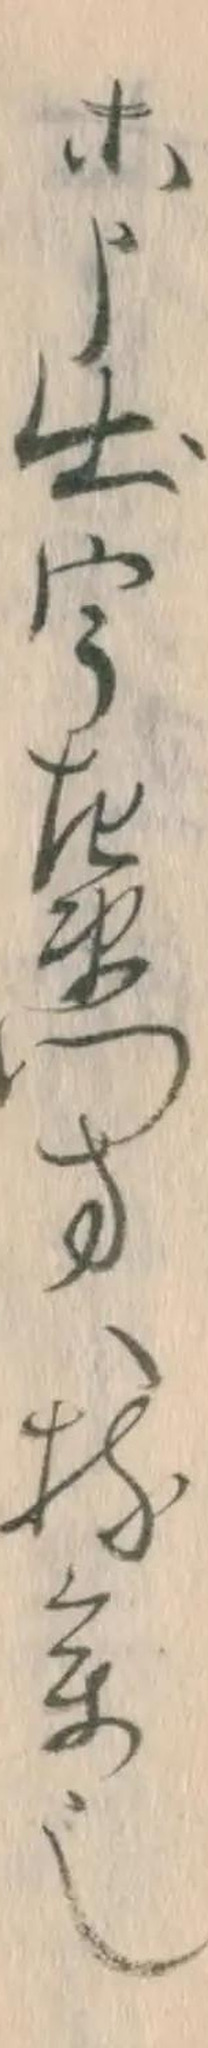等申出宇左衛門方へ持参也
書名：賀茂社記録. 第72冊
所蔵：国立国会図書館 National Diet Library, JAPAN
